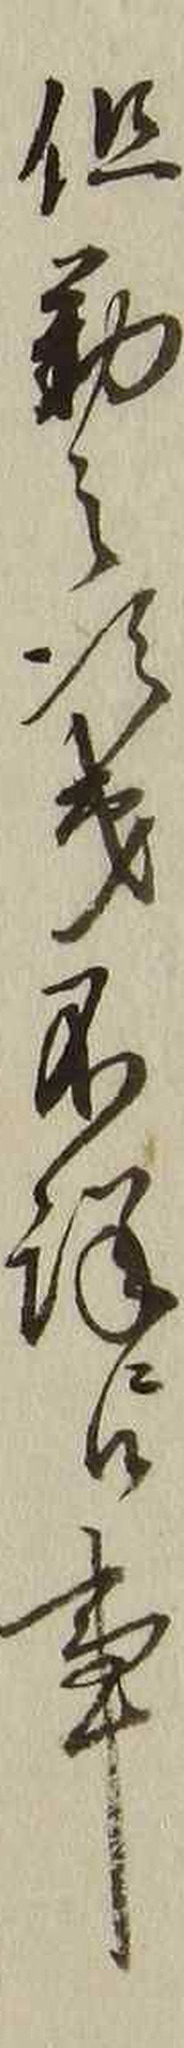但勤之次第不詳ニ候事
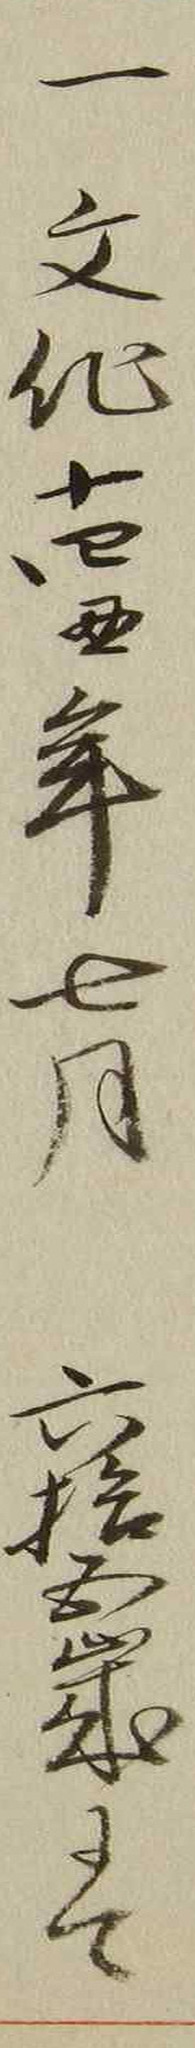一文化十四丑年七月六拾五歳にて
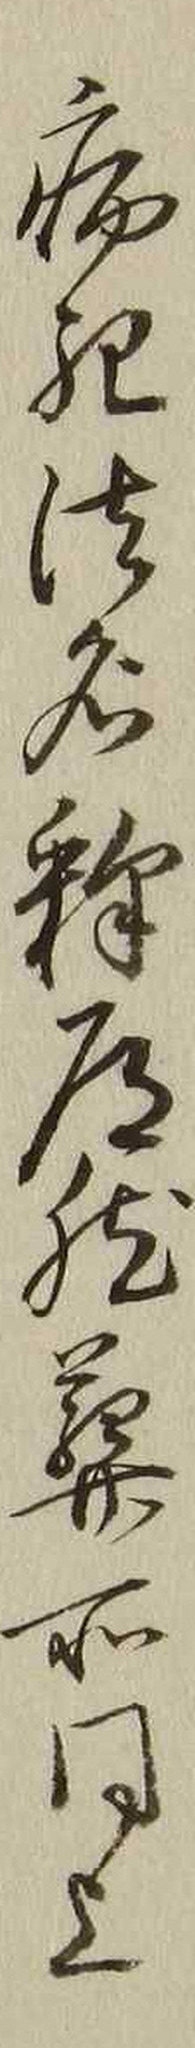病死法名釈道然葬所同上
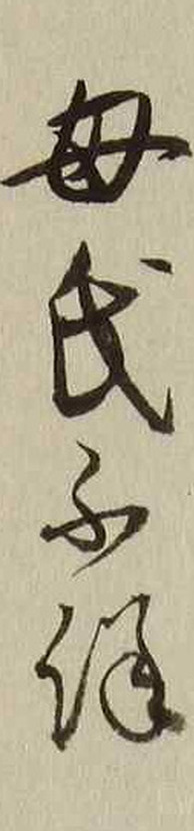母氏不詳
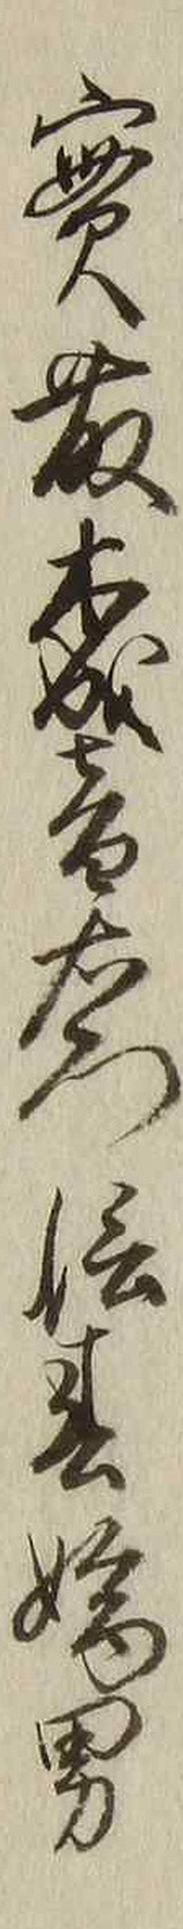実藤森音右衛門信春嫡男
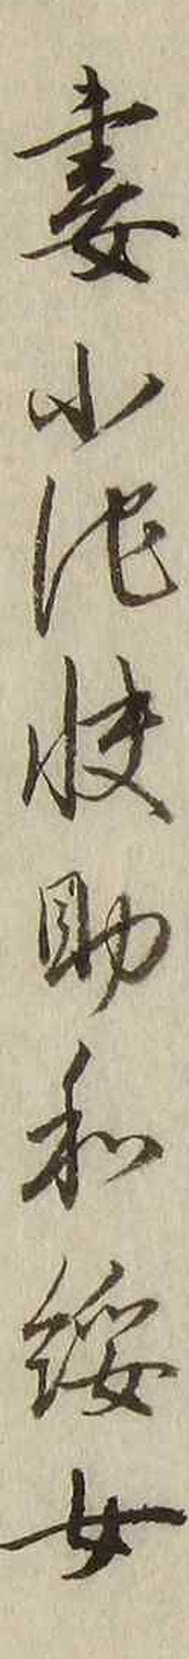妻小池快助和綏女
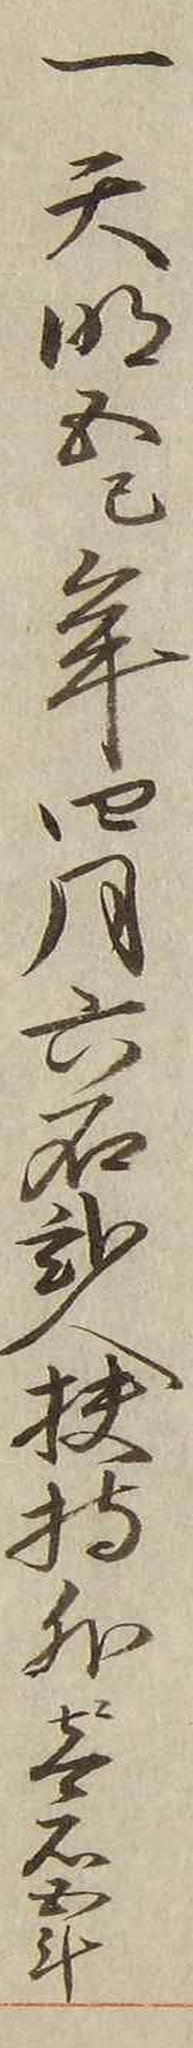一天明五巳年四月六石弐人扶持外ニ壱石五斗
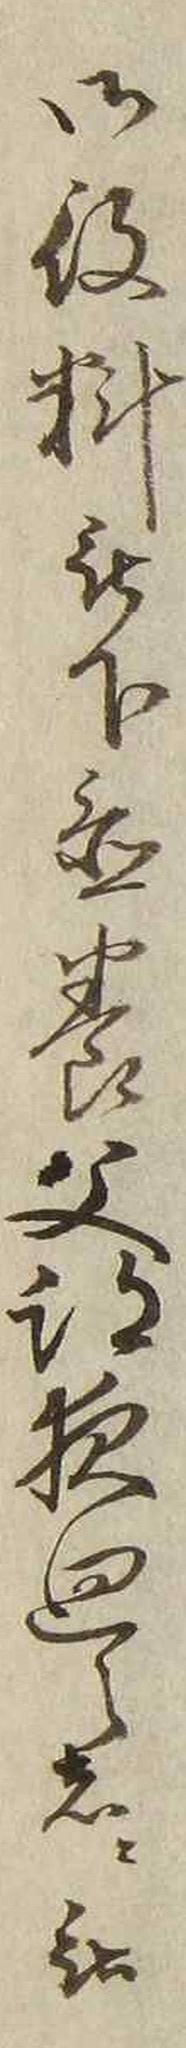御役料被下置養父跡夜廻之者ニ被

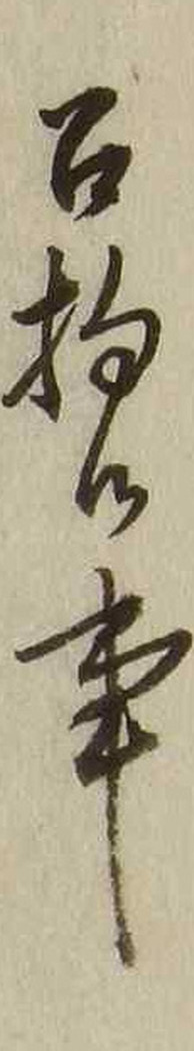召抱候事
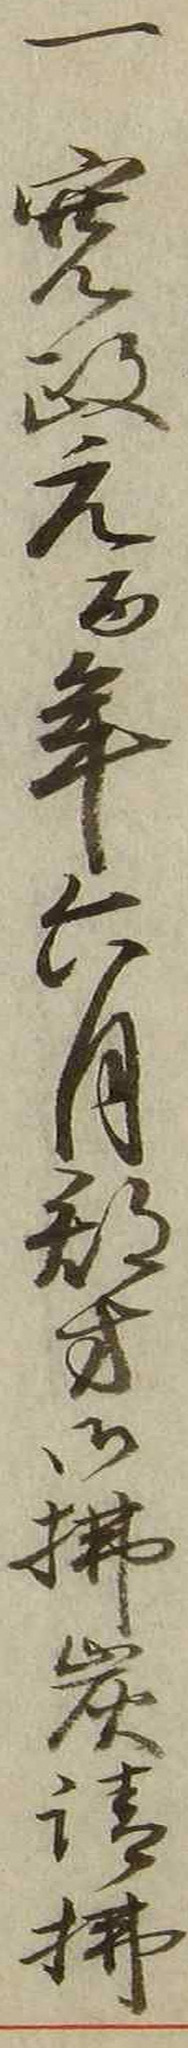一寛政元酉年六月郡方御払炭請払
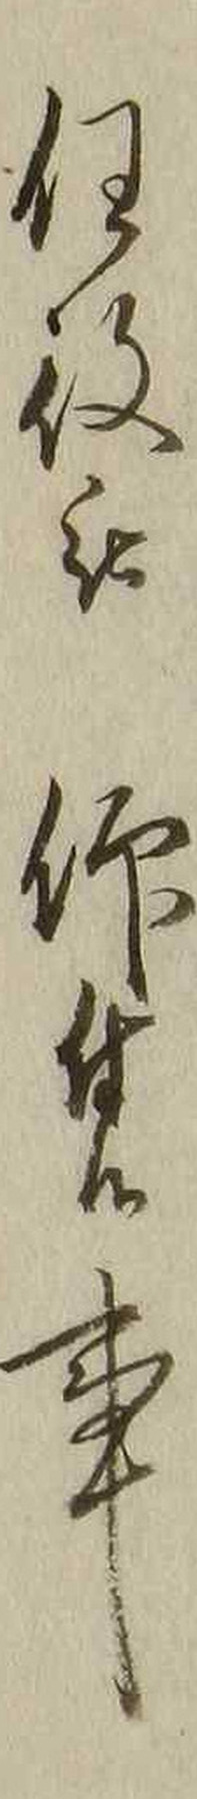任役被仰付候事
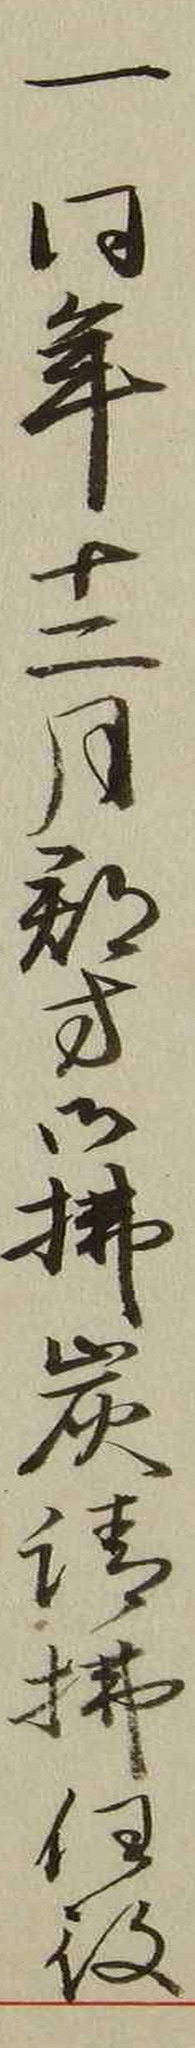一同年十二月郡方御払炭請払任役
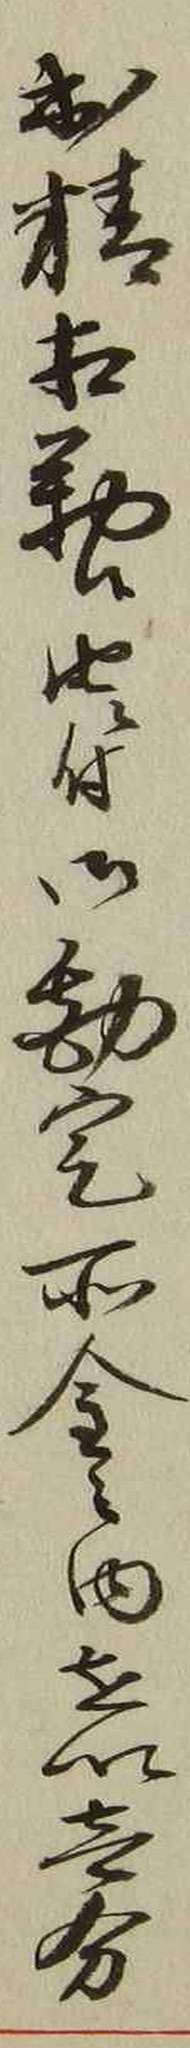出精相勤候由ニ付御勘定所金之内を以壱分
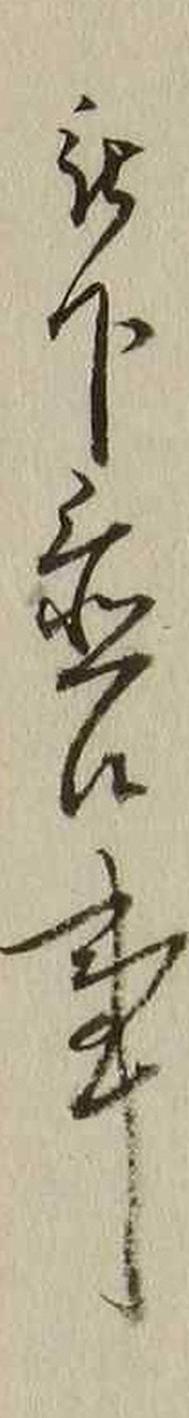被下置候事
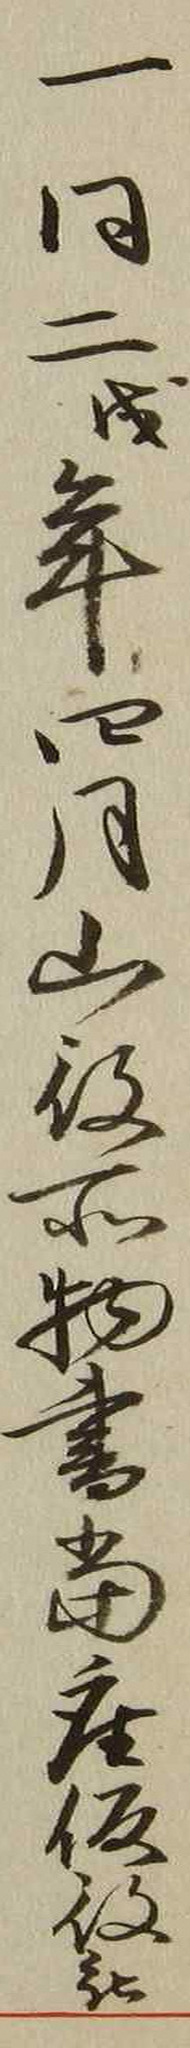一同二戌年四月山役所物書当座仮役被
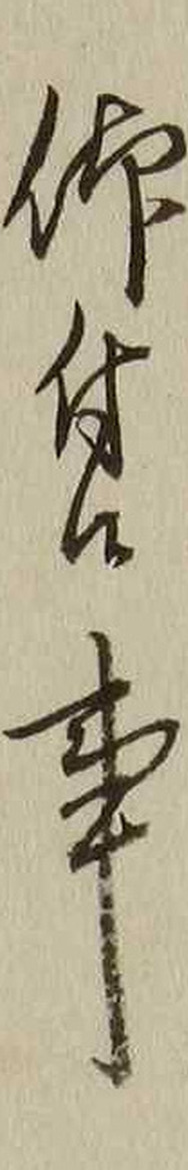仰付候事
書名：諸士系譜　巻之102　か之部10
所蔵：会津若松市立会津図書館
